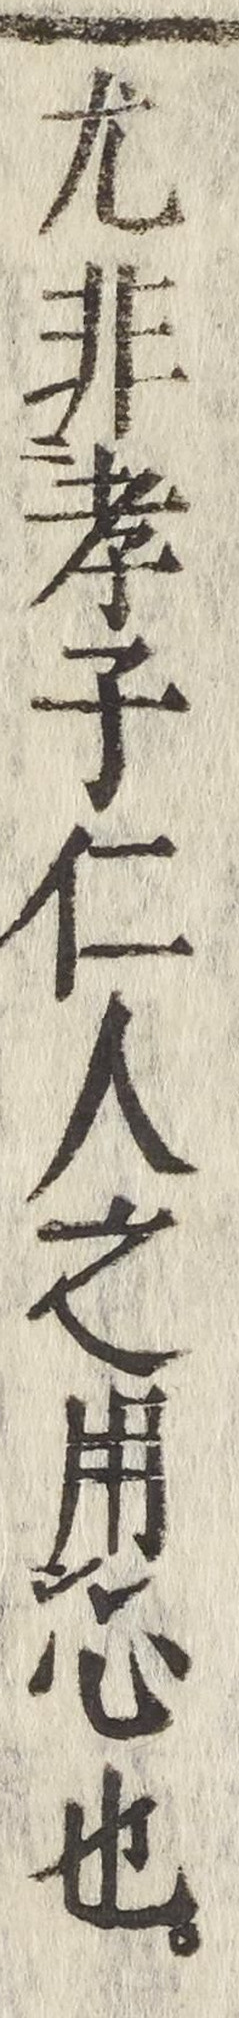尤非孝子仁人之用レ心也。

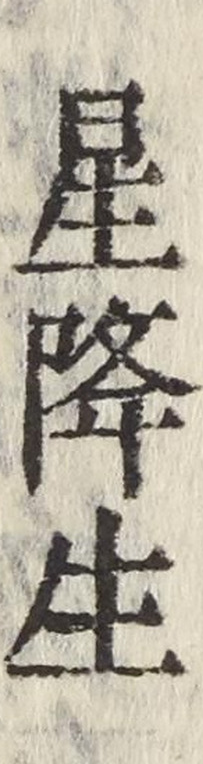星降生

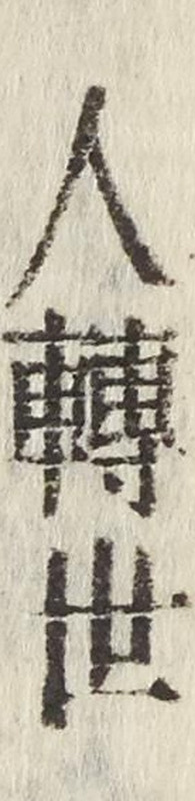人転世

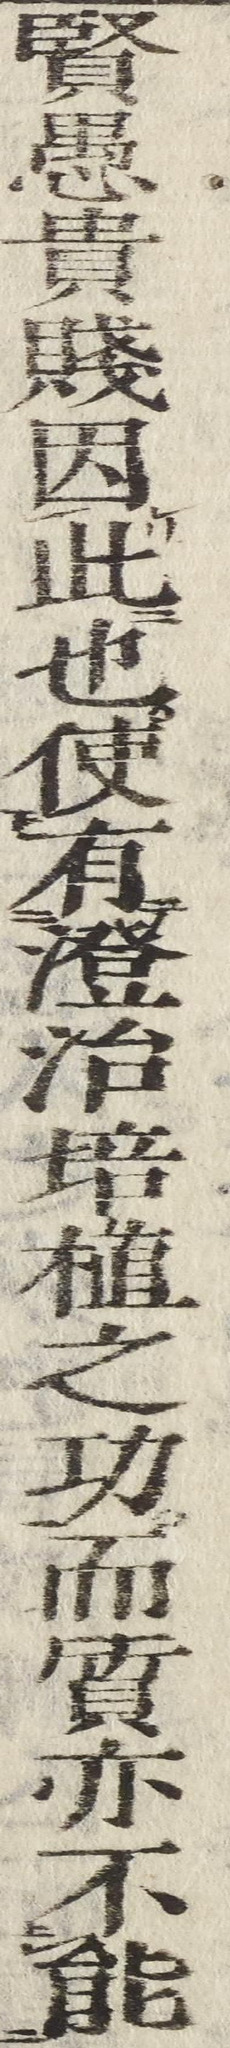賢愚貴賤因此也。使有澄治培ー植之功。而質亦不レ能

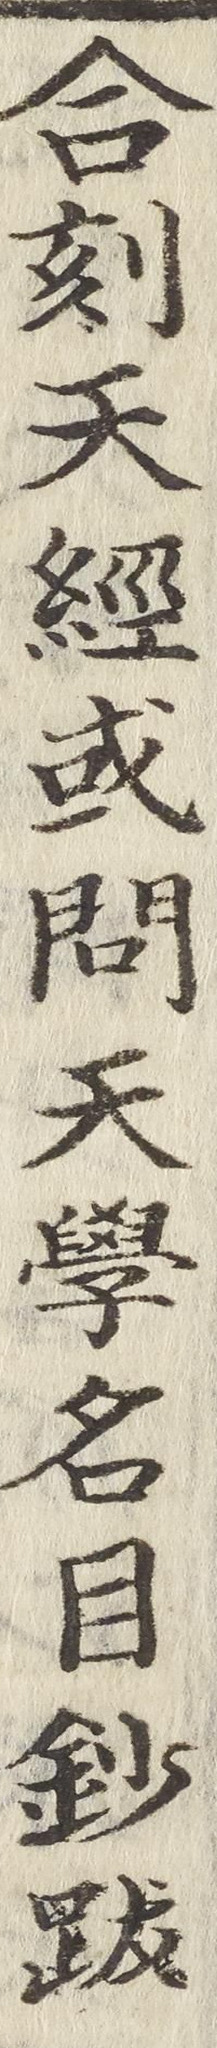合刻天経或問天学名目鈔跋
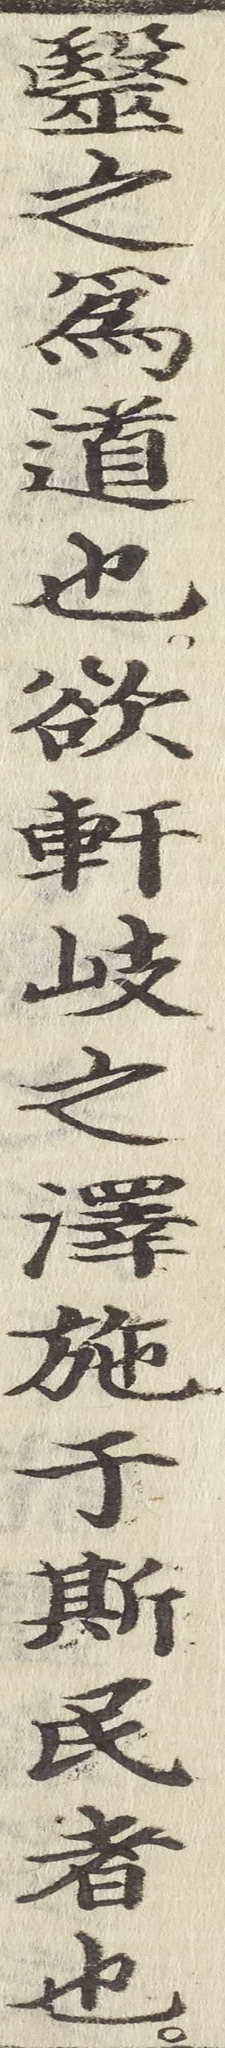医之為道也。欲軒岐之沢施于斯民者也。
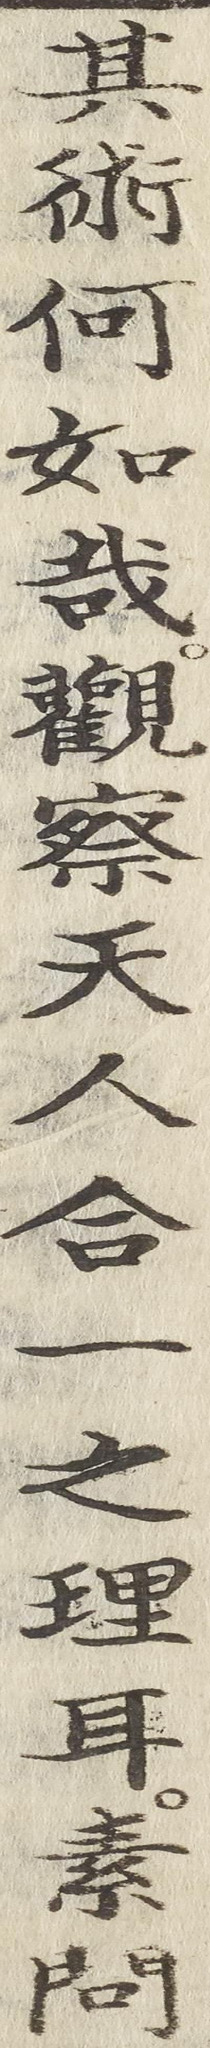其術何如哉。観察天人合一之理耳。素問
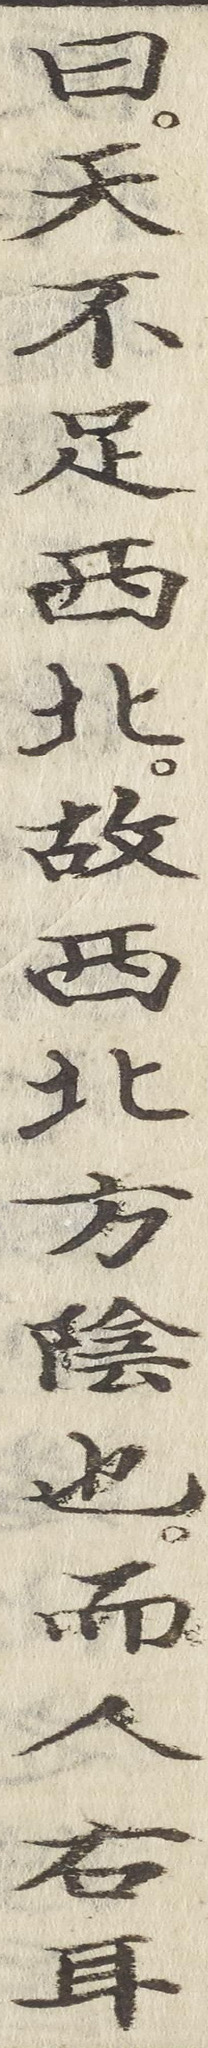曰。天不足西北。故西北方陰也。而人右耳
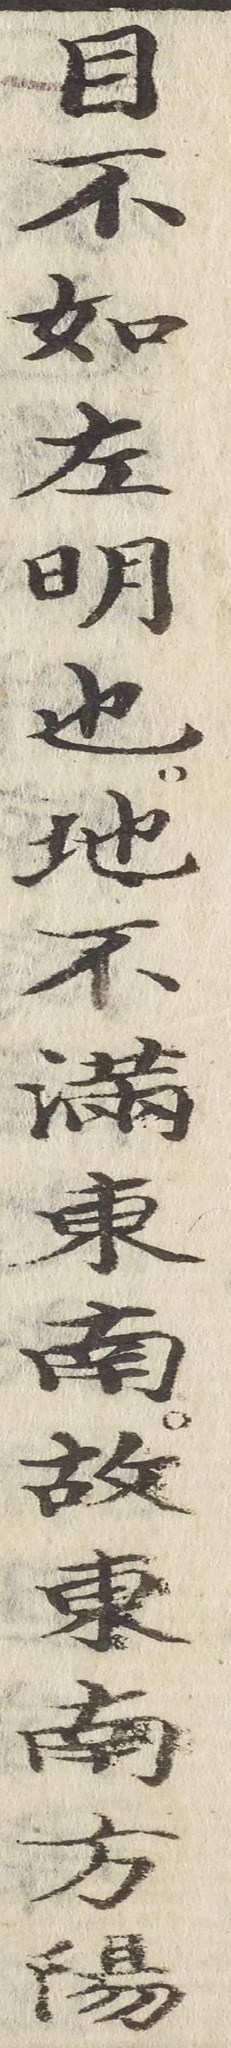目不如左明也。地不満東南。故東南方陽
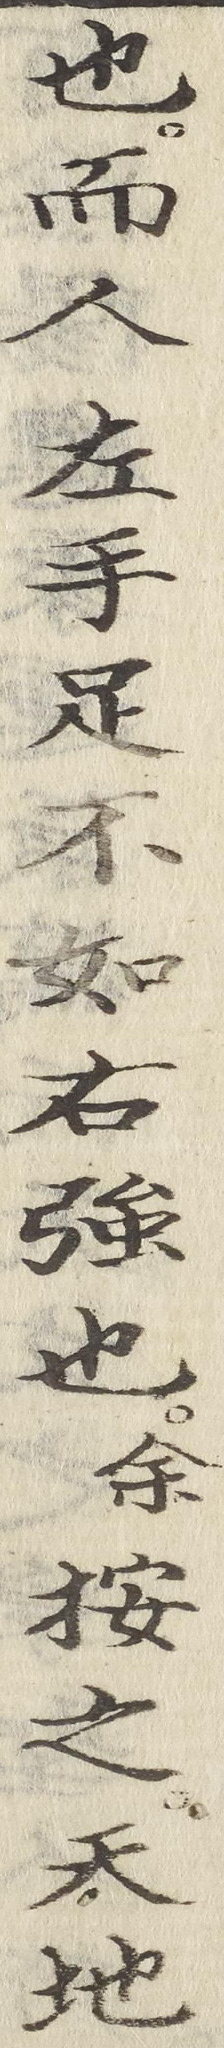也。而人左手足不如右強也。余按之。天地
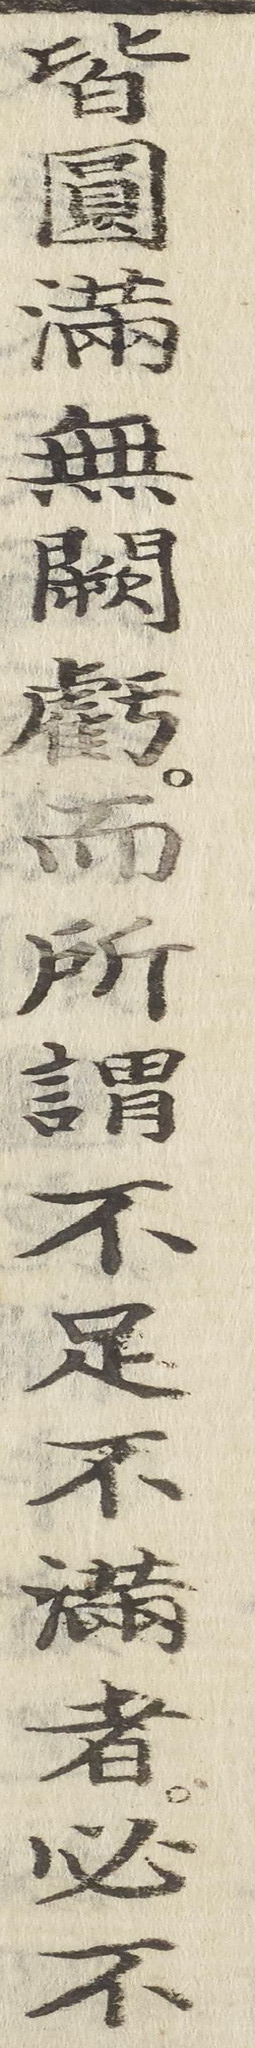皆円満無関虧。而所謂不足不満者。必不
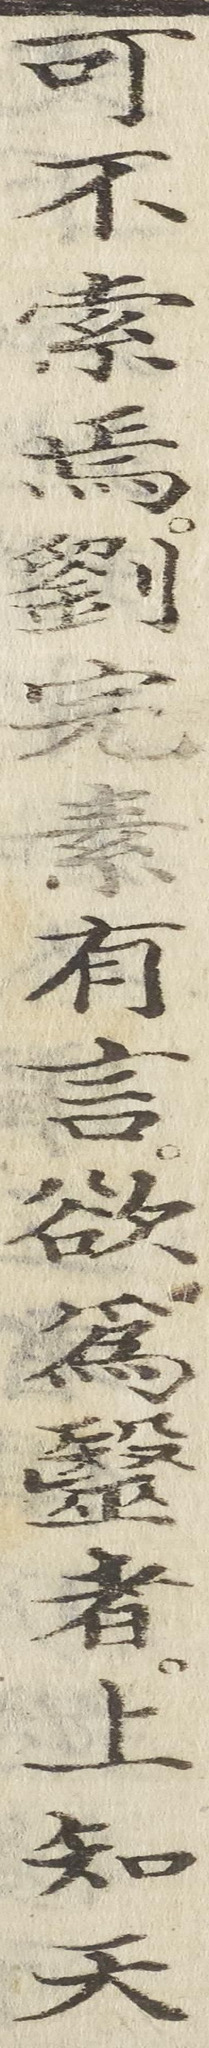可不索焉劉完素有言。欲為医者。上知天

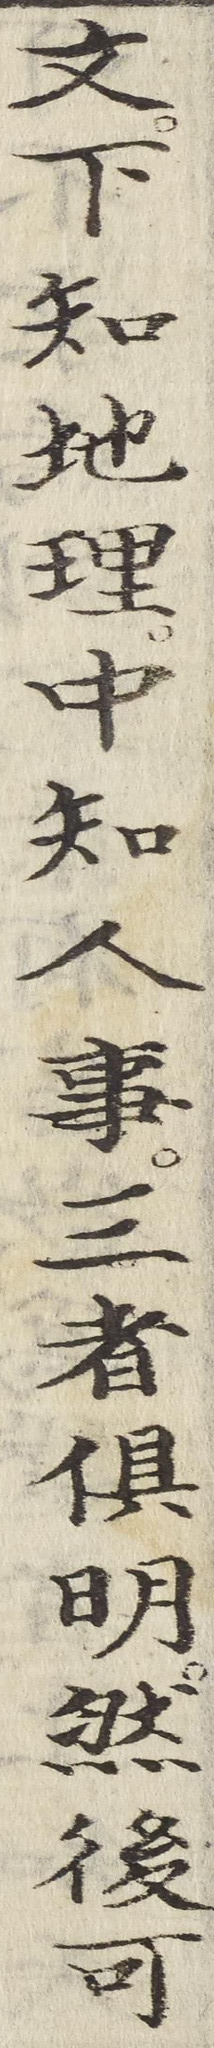文。下知地理。中知人事。三者倶明。然後可
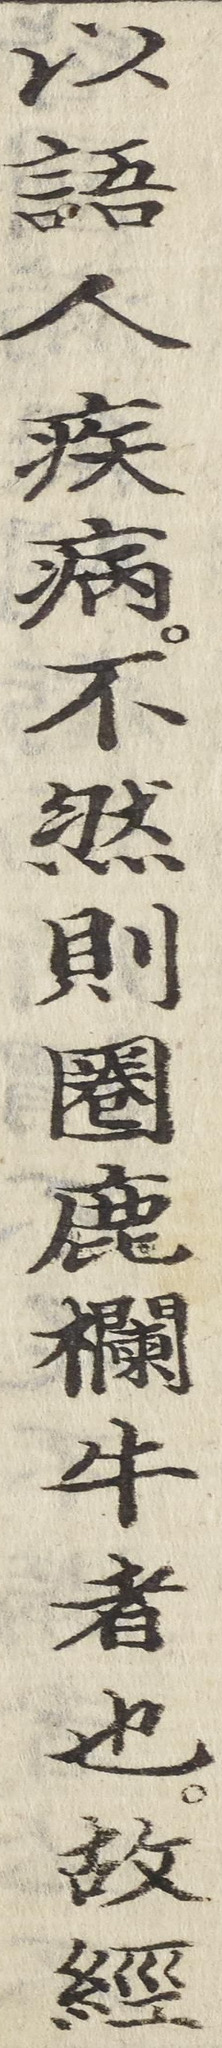以語人疾病。不然則圏鹿欄牛者也。故経
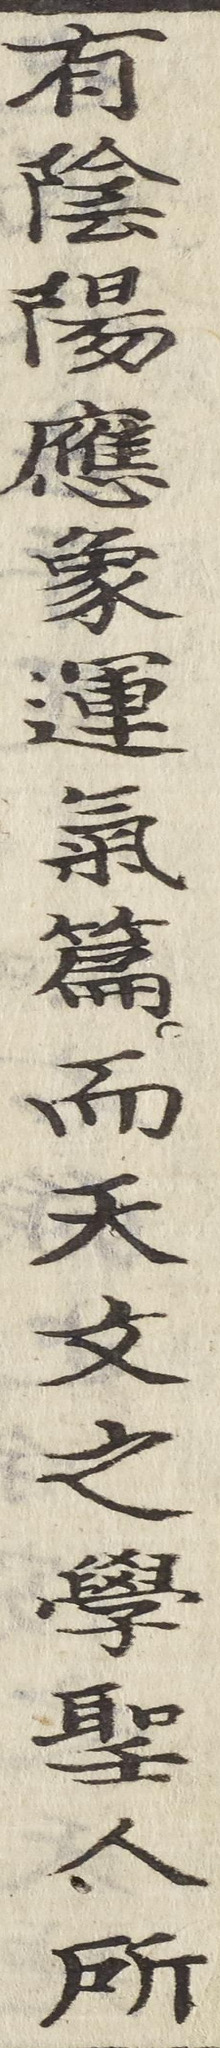有陰陽応象運気篇。而天文之学聖人所
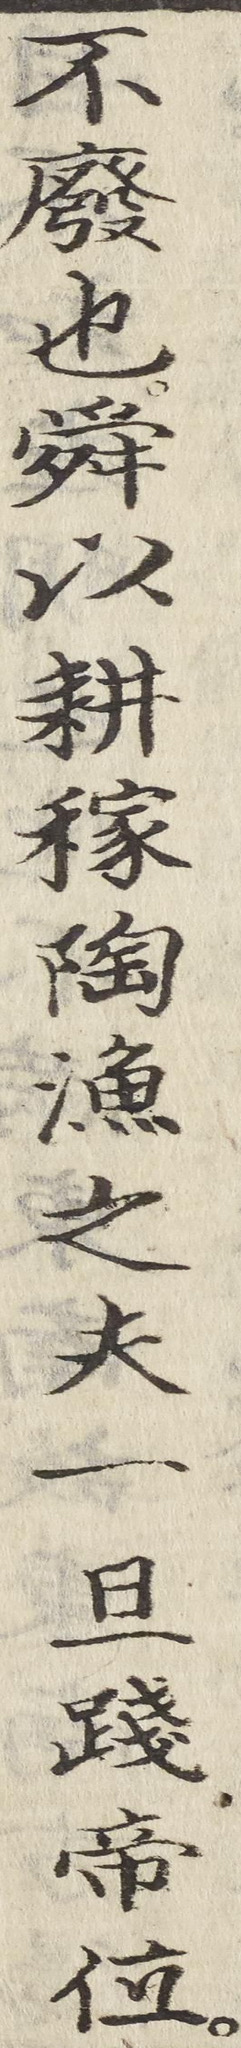不廃也。舜以耕稼陶漁之夫一旦践帝位。
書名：天經或問　地
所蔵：東京大学地震研究所図書室 Earthquake Research Institute Library, The University of Tokyo, JAPAN
